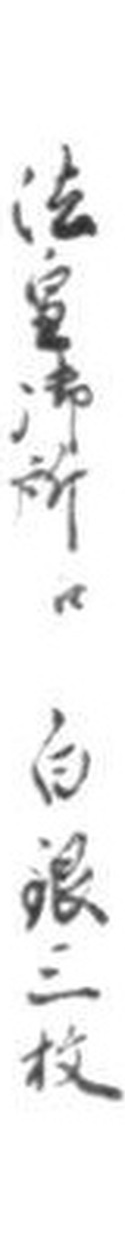法宣御所江白銀三枚
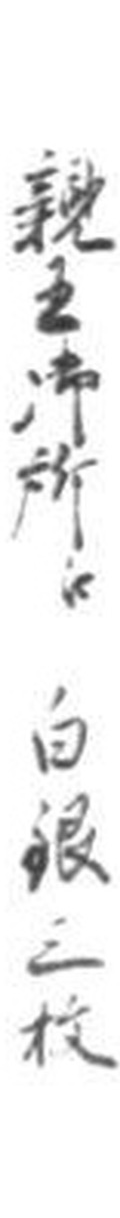親王御所江白銀三枚
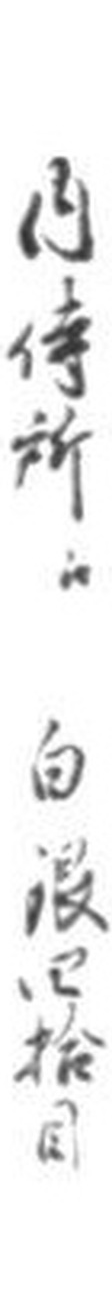内侍所江白銀四拾目
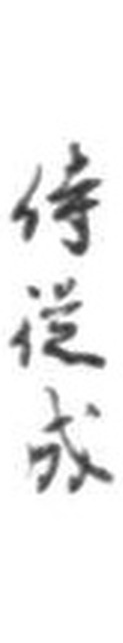侍従成
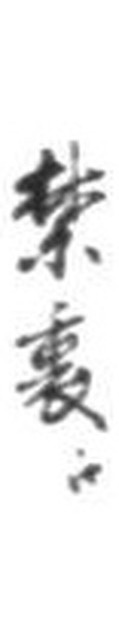禁裏江
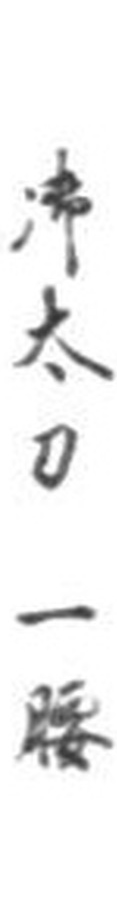御太刀一腰
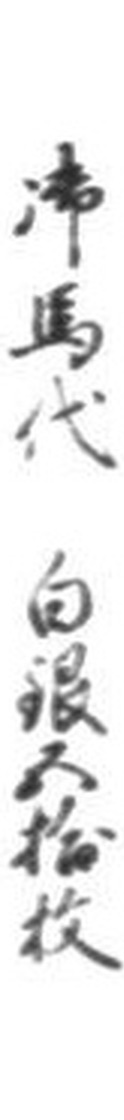御馬代白銀五拾枚
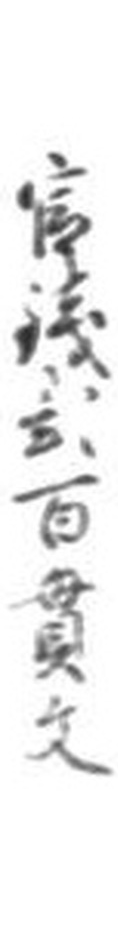官銭弐百貫文
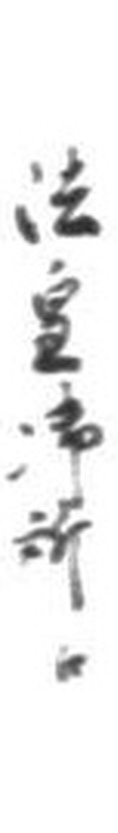法皇御所江
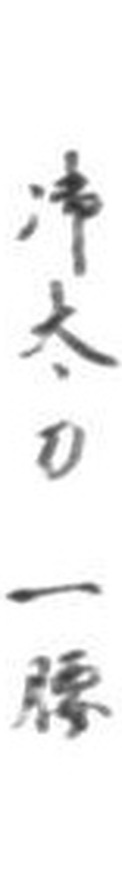御太刀一腰
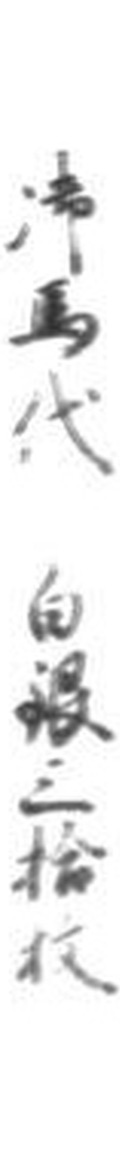御馬代白銀三拾枚
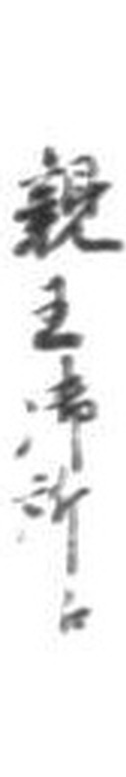親王御所江
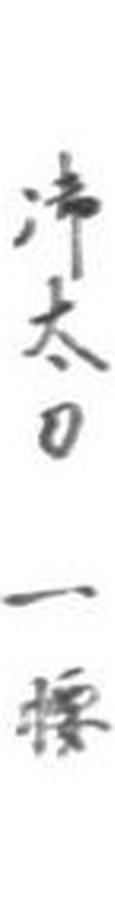御太刀一腰
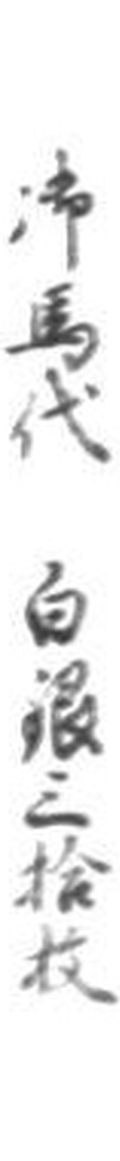御馬代白銀三拾枚
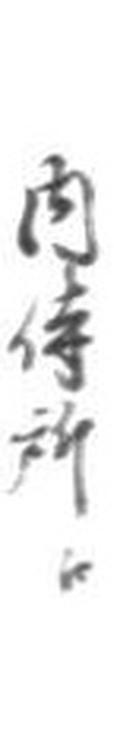内侍所江

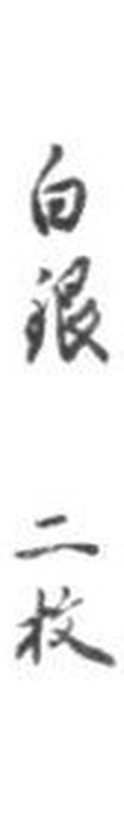白銀二枚
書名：家譜 四十 宗矩公 従享保十一年到享保十二年
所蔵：福井県文書館 Fukui Prefectural Archives
